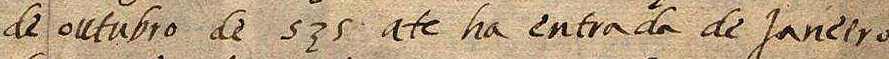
de outubro de 535 ate ha entrada de Janeiro
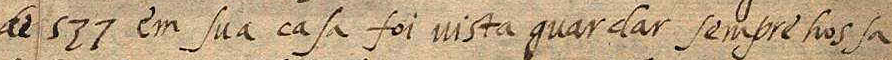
de 537 em sua casa foi uista guardar sempre hos sa
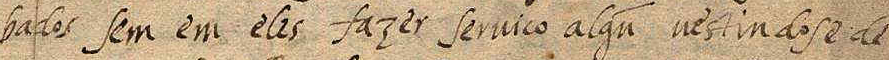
bados sem em eles fazer seruico algu̅ uestindose de
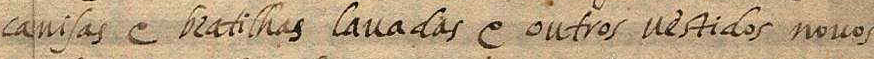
ca_isas e bratilhas lauadas e outros uestidos nouos
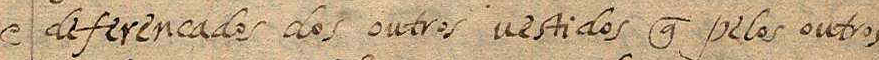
e deferencados dos outros uestidos q̅ pelos outros
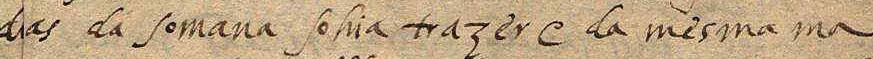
dias da somana so hia trazer e da mesma ma
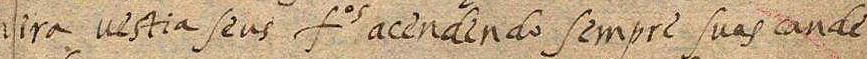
n_ira uestia seus fos acendendo sempre suas cande
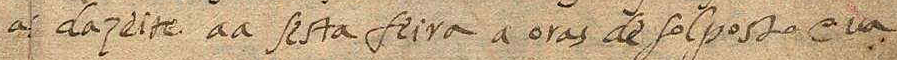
as dazeite aa sesta feira a oras de sol posto e ua
